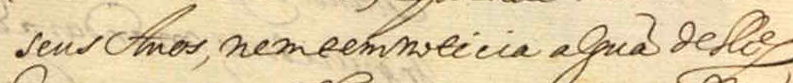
seus Auos, nem tem noticia algum delles
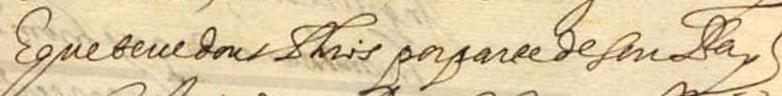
E que teue dous Thios por parte de seu Pay
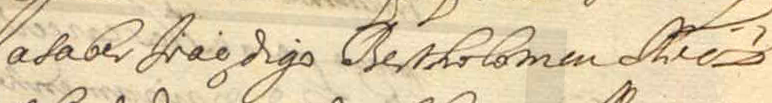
a saber Joao digo Bertholomeu Roiz̄
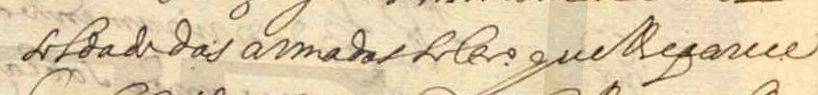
soldado das armadas soltr.o que lhe parece
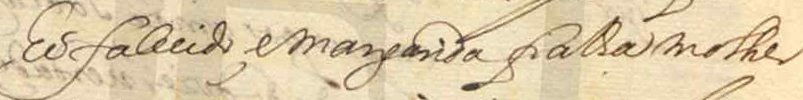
hé falecido, e margarida filha molher
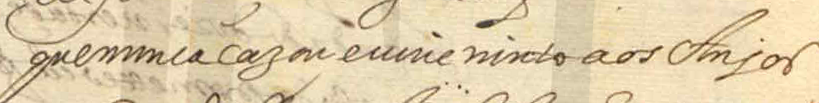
que nunca casou e uiue uinto aos Anjos
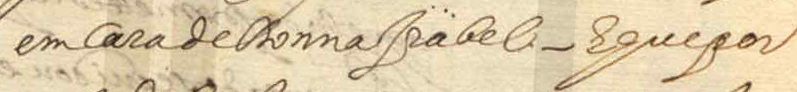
em Caza de Donna Jzabel - E que por
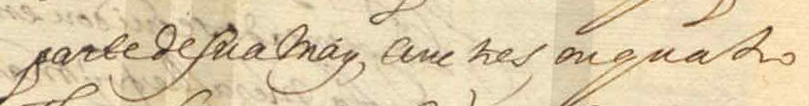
parte de sua may, teue tres, ou quatro
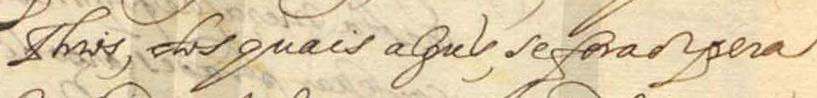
Thios, dos quais algūs se foraõ pera
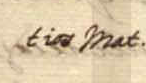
tios mat.
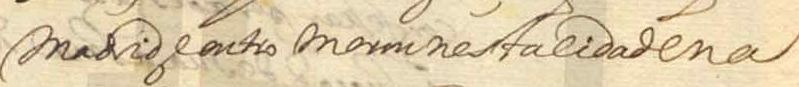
madrid, e outro morou nesta cidade na
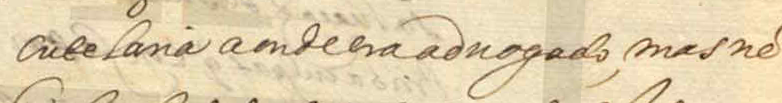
cutelaria aonde era aduogado, mas nē
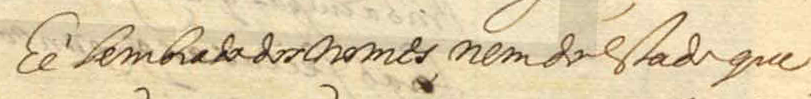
hè lembrada dos nomes, nem do estado que
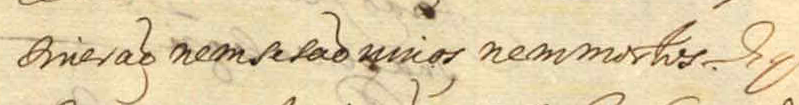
tiueraõ, nem se saõ uiuos, nem mortos. E q̄
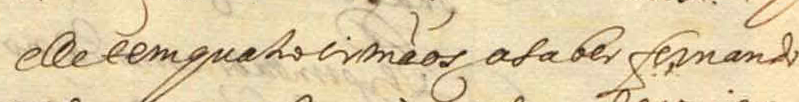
elle tem quatro irmãos, a saber fernando
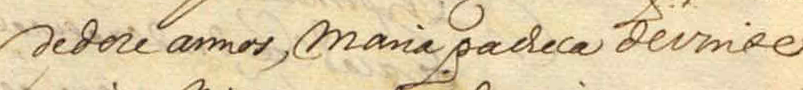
de doze annos, maria pacheca de vinte
